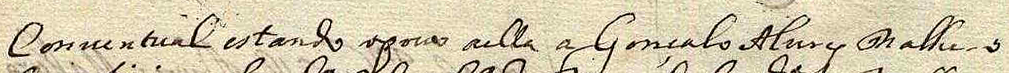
Conuentual estando o pouo a ella a Gonçalo Alures Malheiro
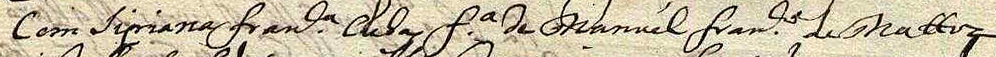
Com Siprianas fran.ca Cuba f.a de Manuel fran.co de Mattoz
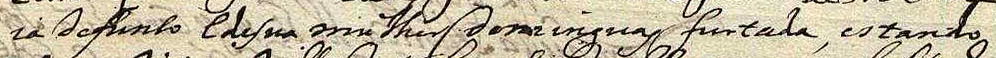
ia defunto e de sua mulher dominguas furtada, estando
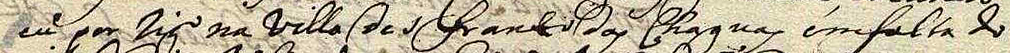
eu por Vigo na Villa de s Franco das Chaguas em falta do
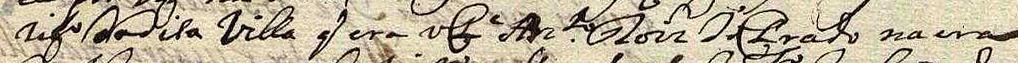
vigo da dita Villa q̄ era o Pe An.to Roiz̄ do Prado na era
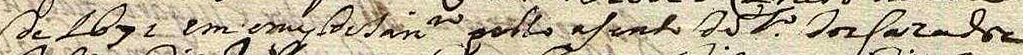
de 1671 em o mes de Ianro pello asento do L.o dos Cazados
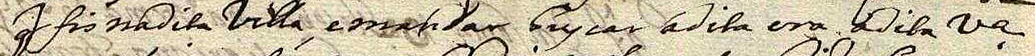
q̄ fis na dita Villa, e mandar buscar a dita era a dita v.a
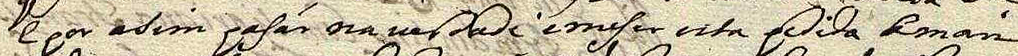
E por asim pasar na uerdade e me ser esta pedida E man
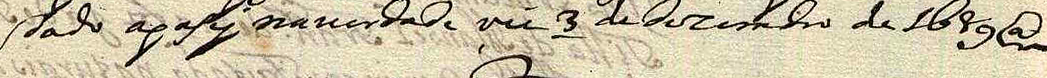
dado a pasej na uerdade oie 3 de dezembro de 1689 ā
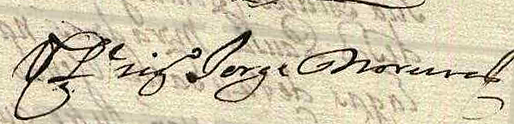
O Pe vig.o Iorge Moreira
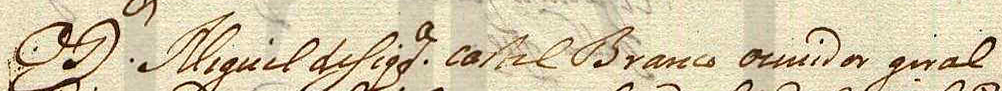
O D.or Miguel de siqr.a castel Branco ouuidor geral
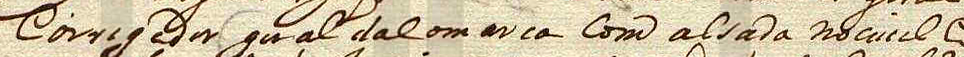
Corregedor geral da comarca com alsada no ciuel e
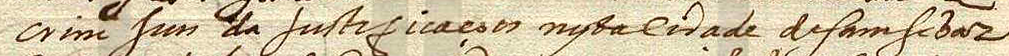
crim Juis da Justificaçoes nesta cidade de sam sebaz
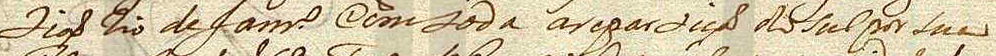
tiaõ Rio de Janr.o com toda a repartiçaõ do sul por sua
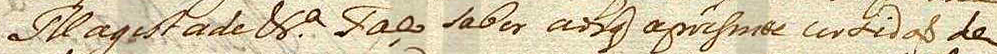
Magestade &.a Faço saber aos q̄ a presente certidaõ de
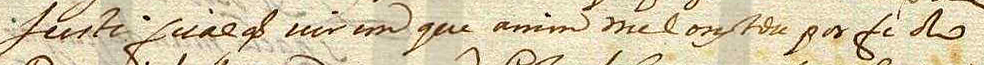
Justificaçaõ uirem que a mim me constou por fé do
